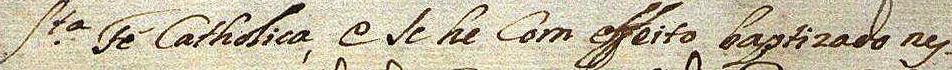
S.ta Fé Catholica, e se he Com effeito baptizado nes
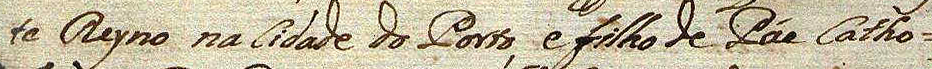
te Reyno na Cidade do Porto, e filho de Páe Catho
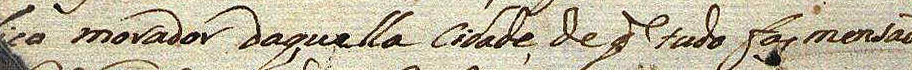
ico morador daquella cidade, de q̄ tudo fas mensão
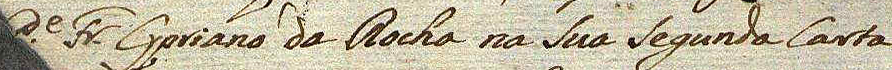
P.e Fr. Cypriano da Rocha na sua segunda Carta
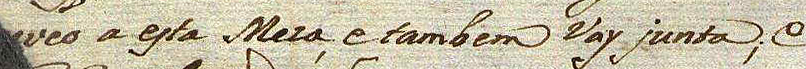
veo a esta Meza, e tambem vay junta; e
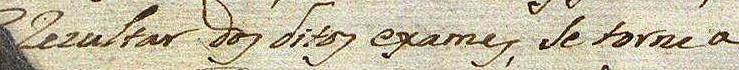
Rezultar dos ditos exames, se torne a
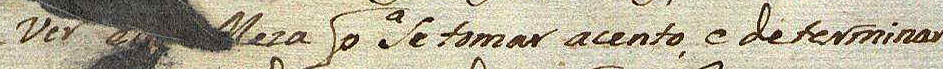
ver em Meza pa se tomar acento, e determinar
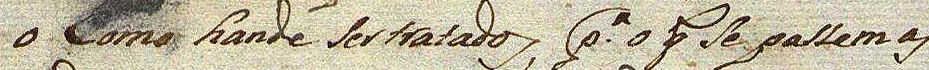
o Como han de ser tratados, p.a o q̄ se passem as
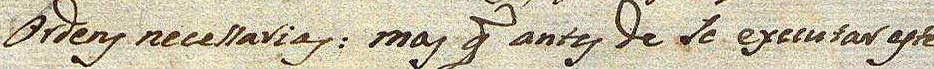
Ordens necessarias: mas q̄ antes de se executar este
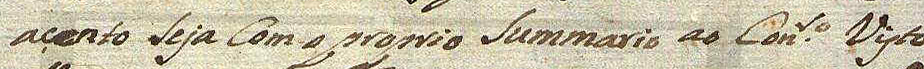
açento seja Com o proprio summario ao Con.so Visto
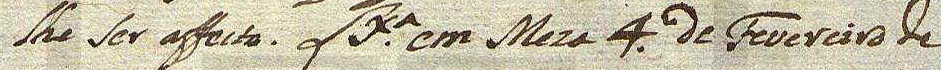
lhe ser affecto. Lx.a em Meza 4. de Fevereiro de
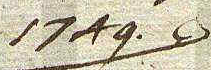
1749.
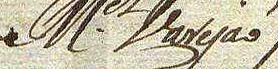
M.eL Varejaõ
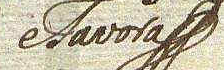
e Tavora
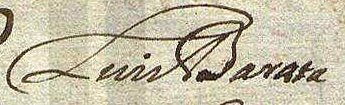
Luis Barata
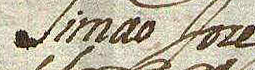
Simaõ Joze
